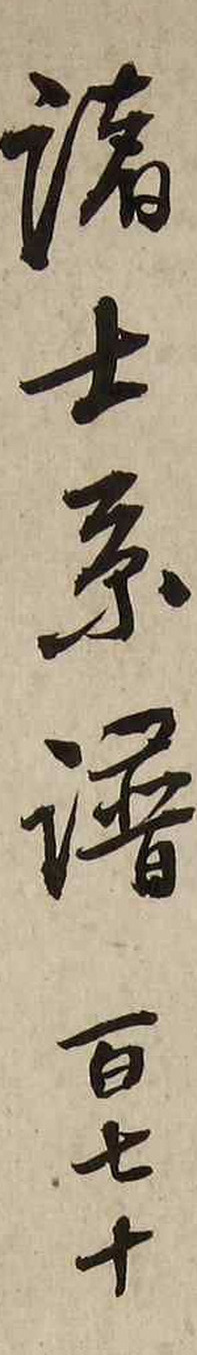諸士系譜百七十

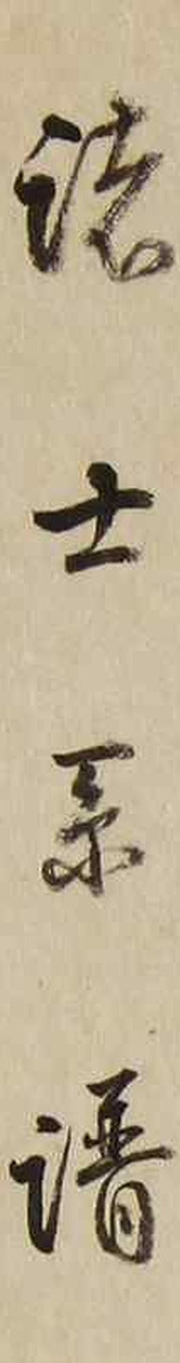諸士系譜

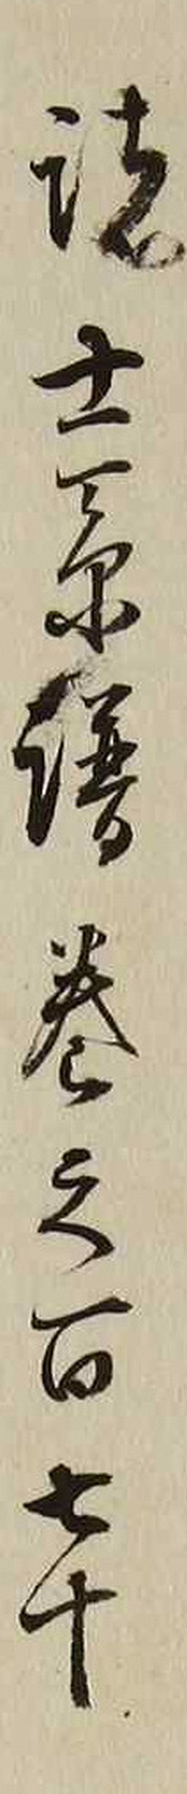諸士系譜巻之百七十
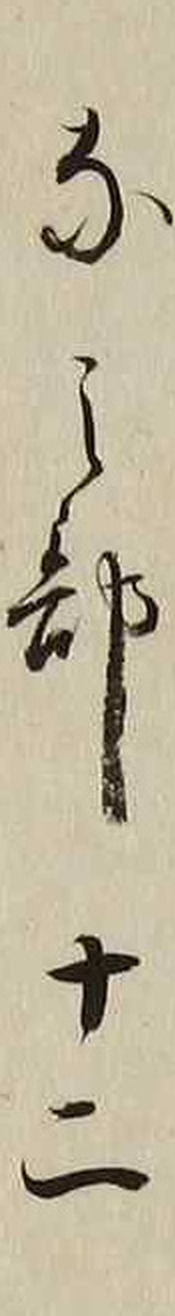なの部十二
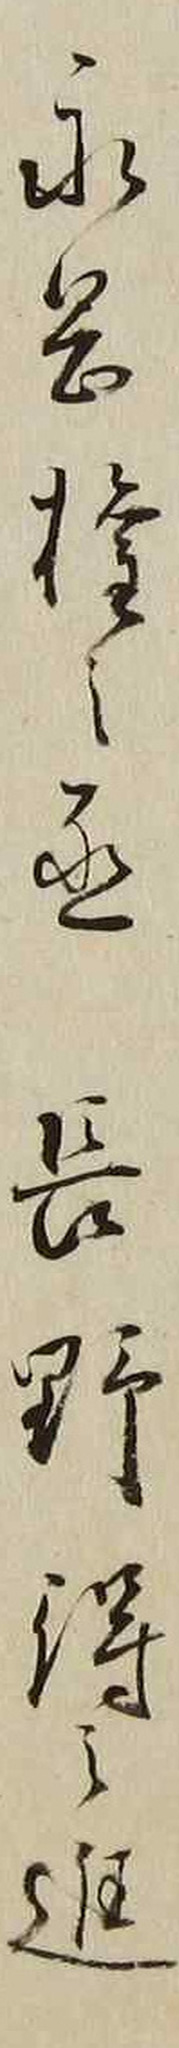永岡権之丞長野得之進

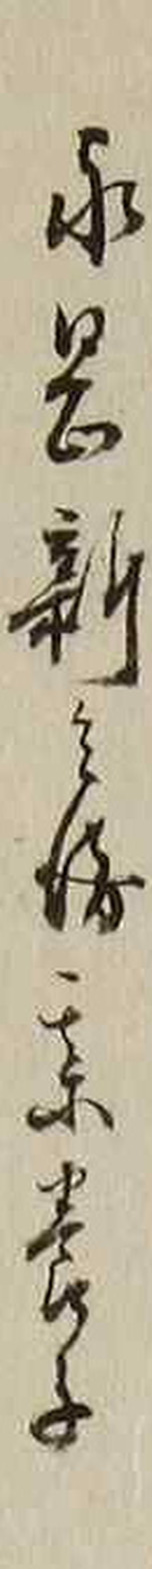永岡新兵衛某養子
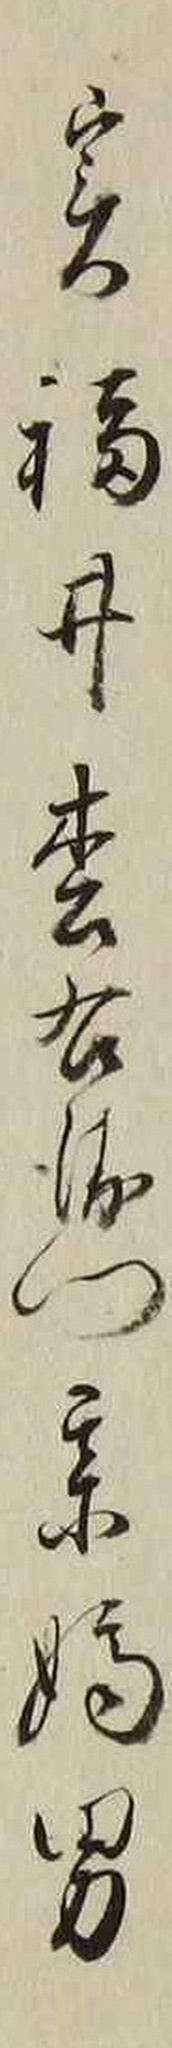実福井杢右衛門某嫡男

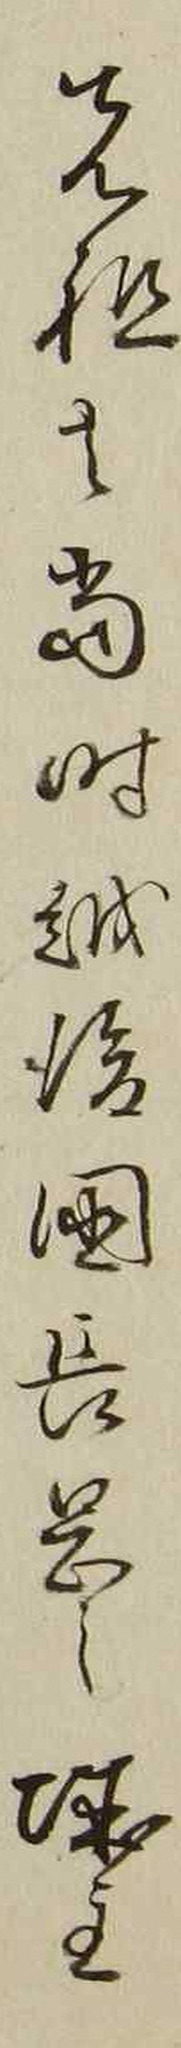先祖は当時越後国長岡之城主
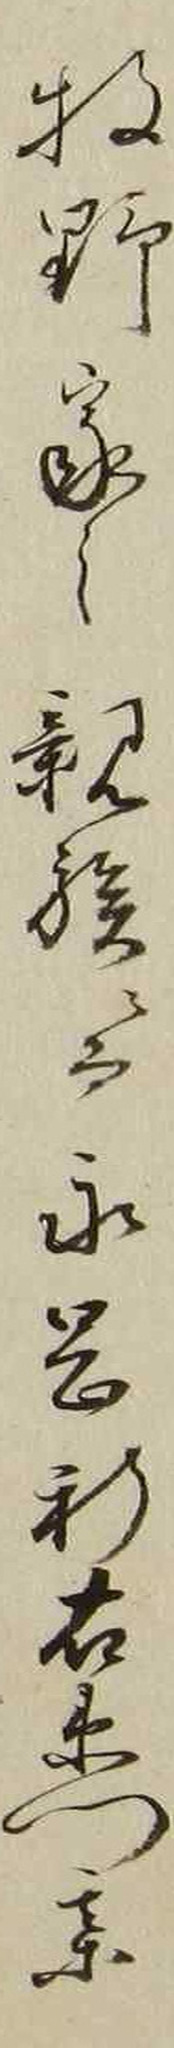牧野家之親族にて永岡新右衛門某
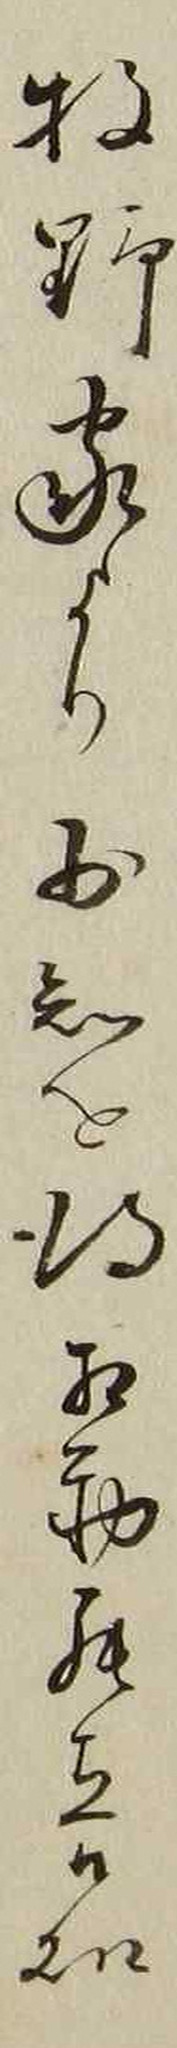牧野家より少知を得相勤罷在候処
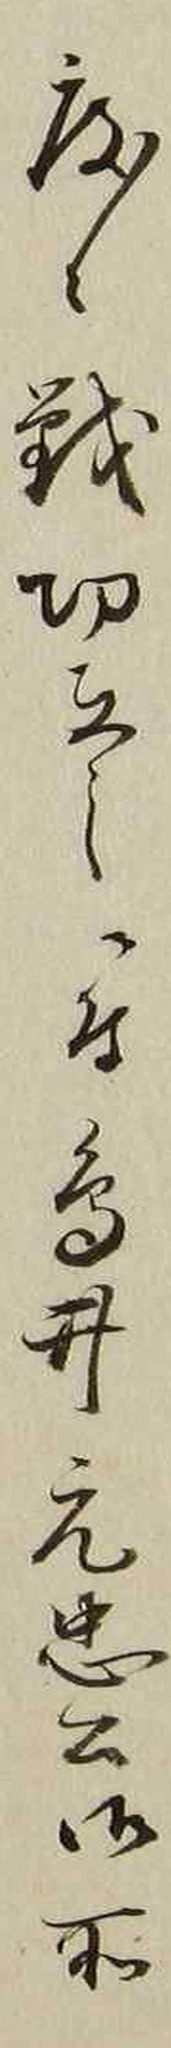度々戦功在之に付鳥井元忠公御所
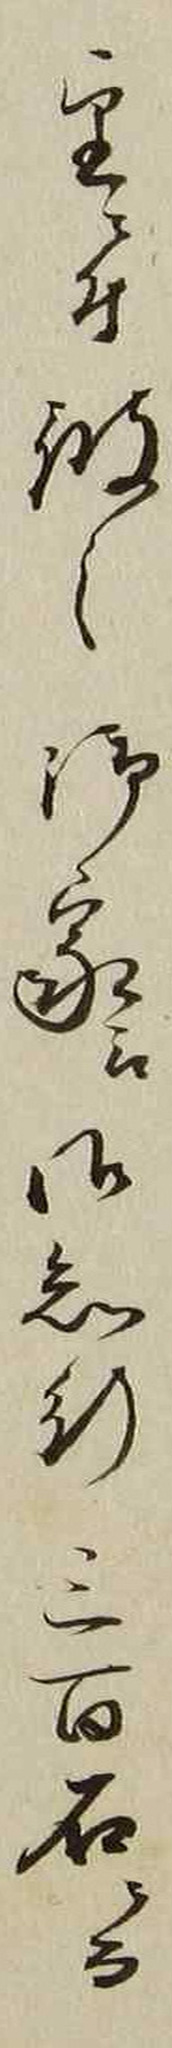望に付彼之御家へ御知行三百石にて
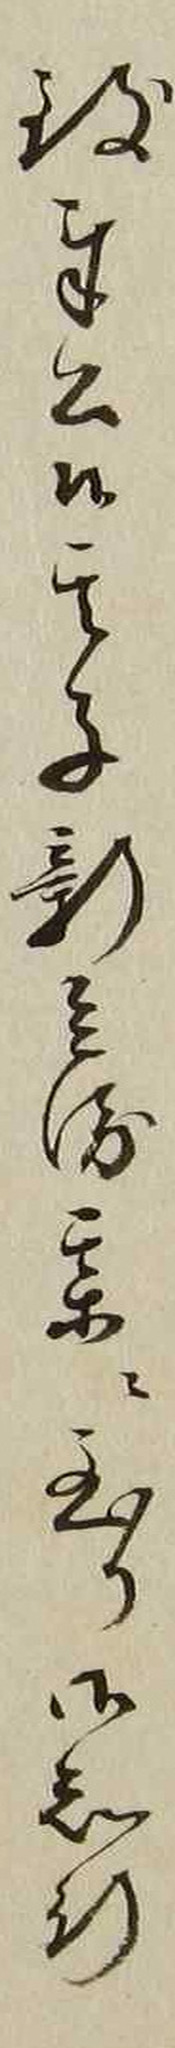致奉公候其子新兵衛某に至り御知行
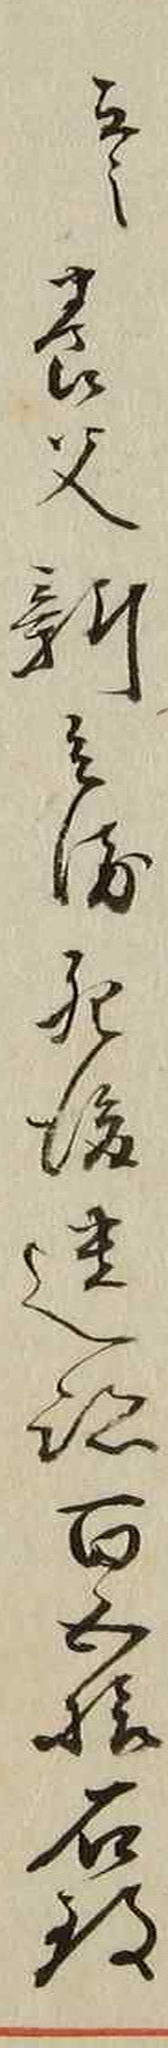有之養父新兵衛死後遺跡百五十石致
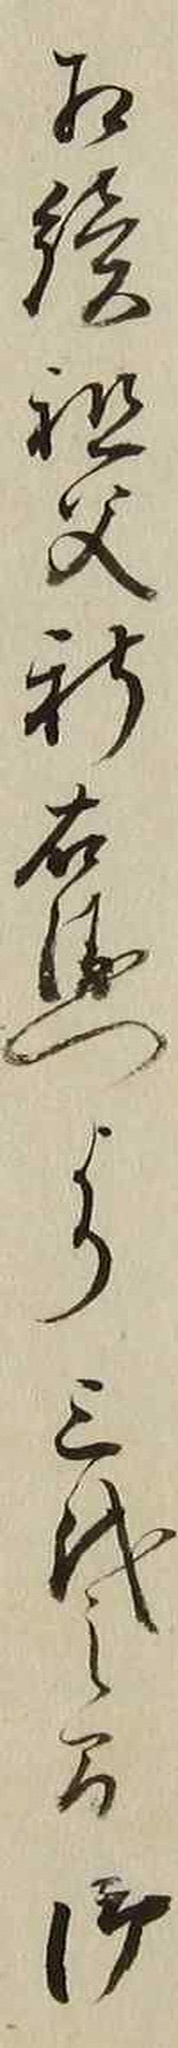相続祖父新右衛門より三代之間御
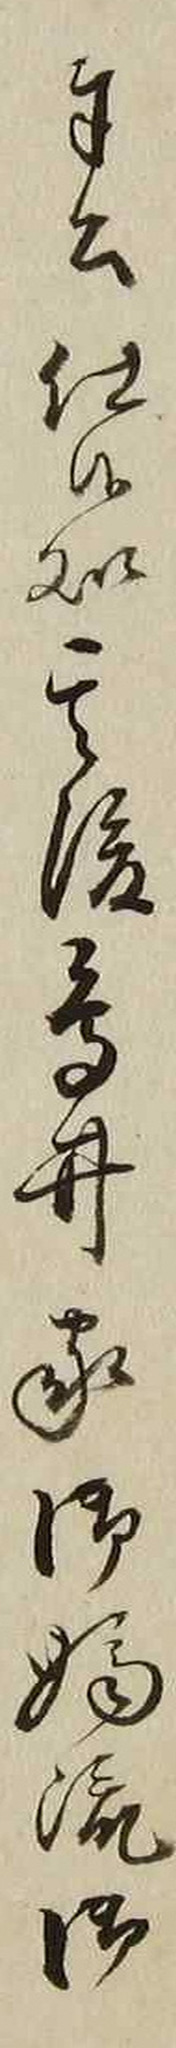奉公仕候処其後鳥井家御嫡流御
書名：諸士系譜　巻之170　な之部12
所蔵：会津若松市立会津図書館
